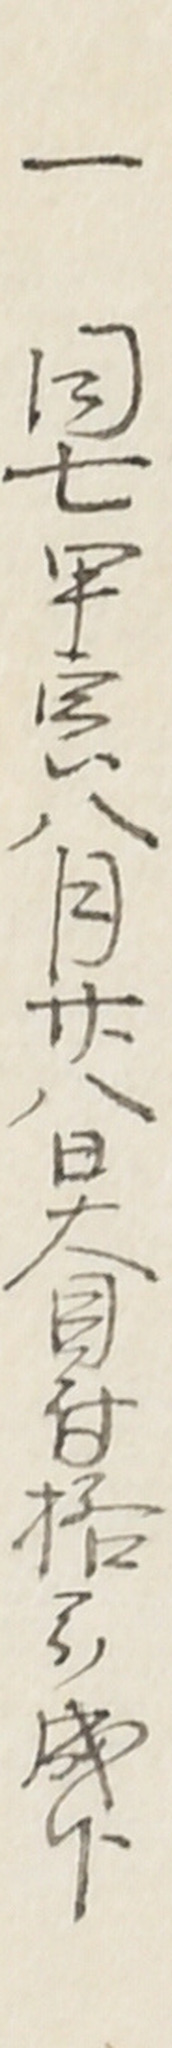一同七甲寅八月廿八日大目付格被成下
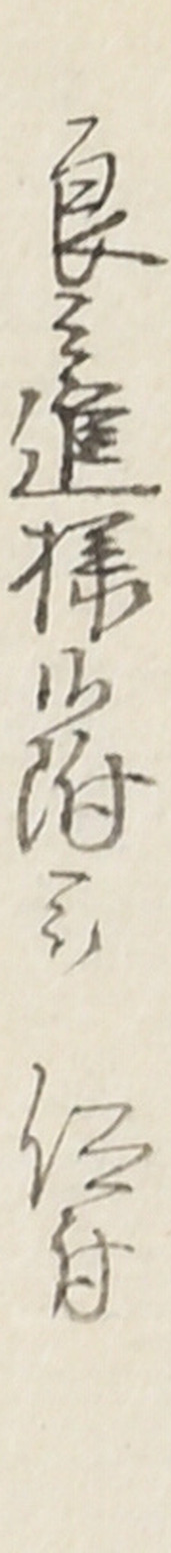良之進様御附被仰付
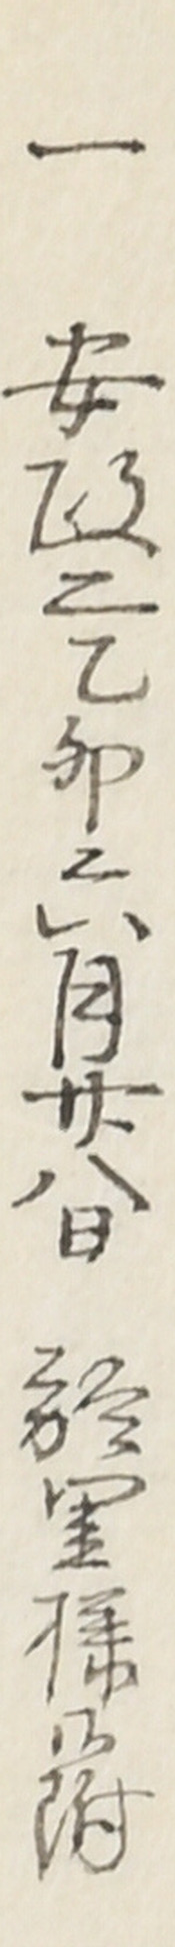一安政二乙卯六月廿八日於里様御附
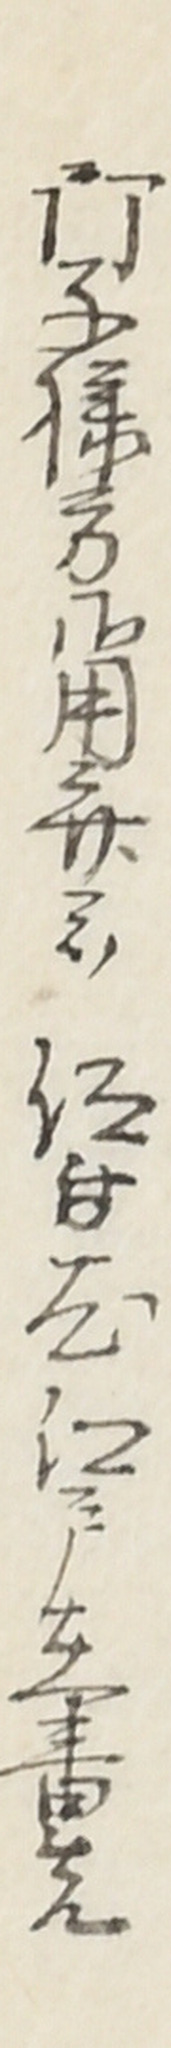御子様方御用弁被仰付尤江戸在番先
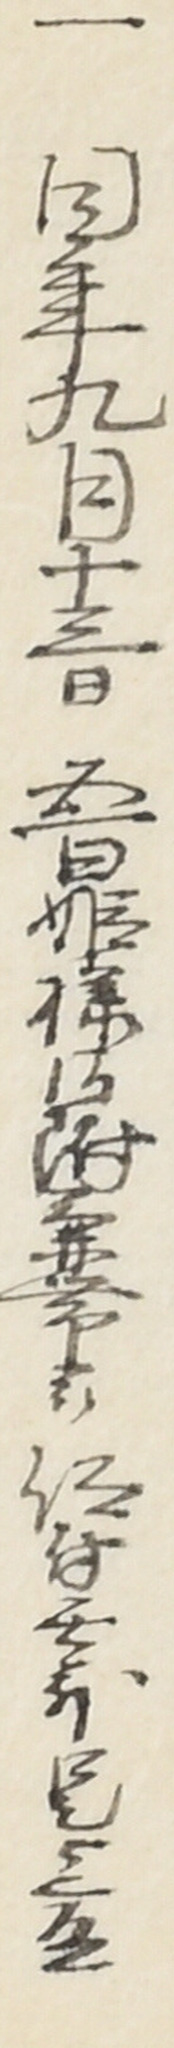一同年九月十三日五百姫様御附兼帯被仰付其外是迄通

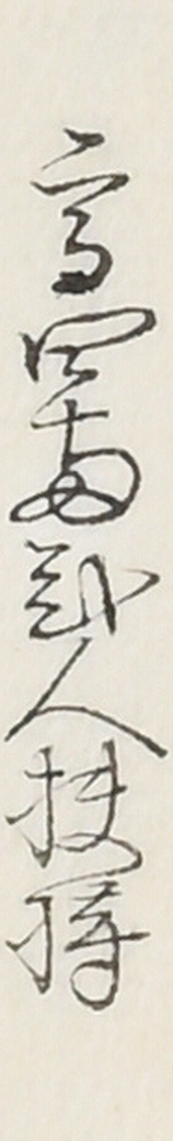高田両弐人扶持
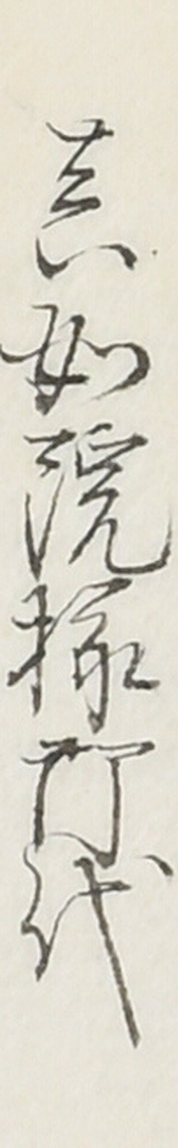真如院様御代
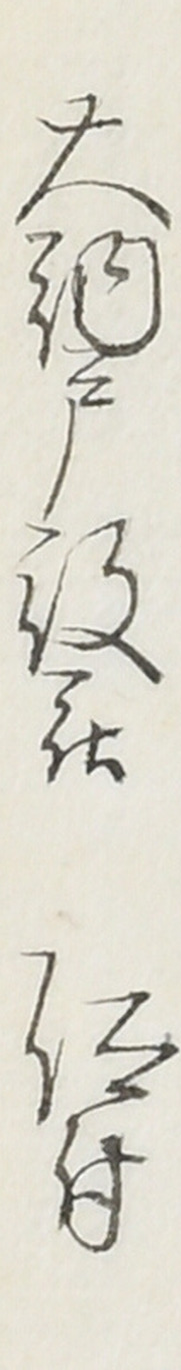大納言戸役被仰付
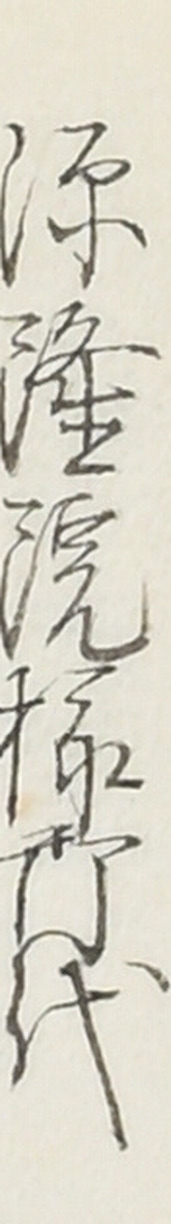源隆院様御代
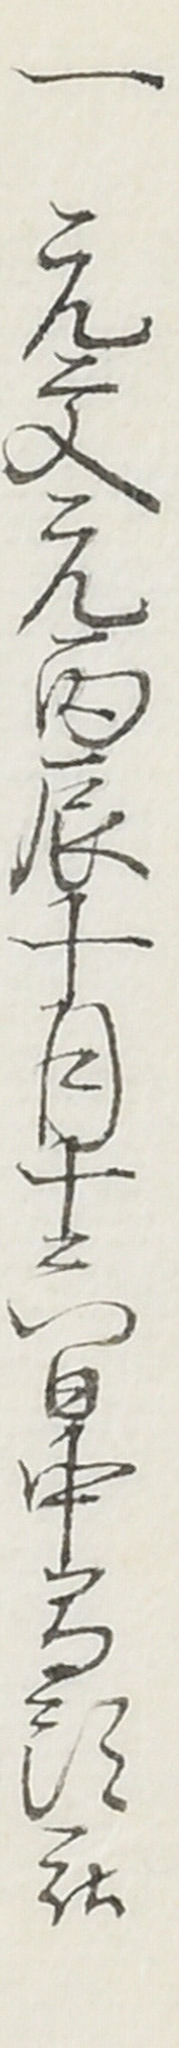一元文元丙辰十月十六日中頭頭被
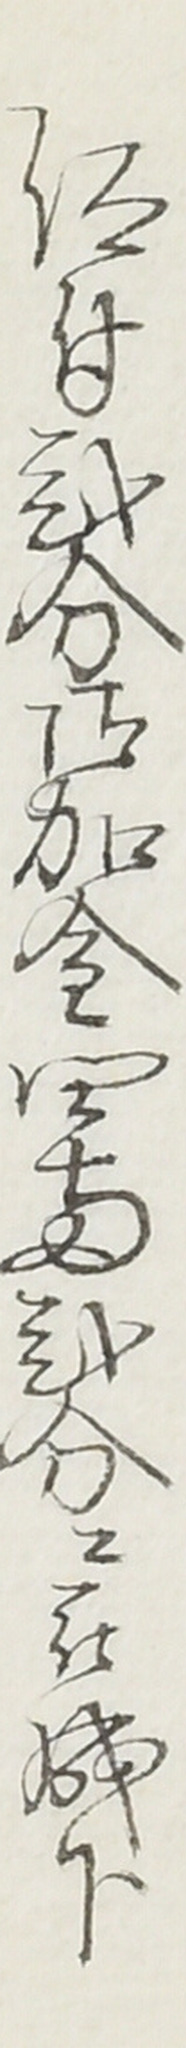仰付弐分御加金四両弐分ニ被成下
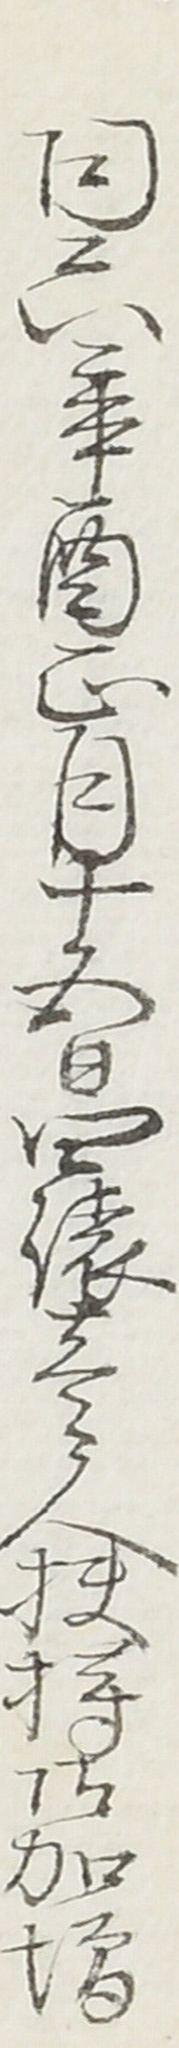一同六辛酉正月十五日四俵壱人扶持御加増
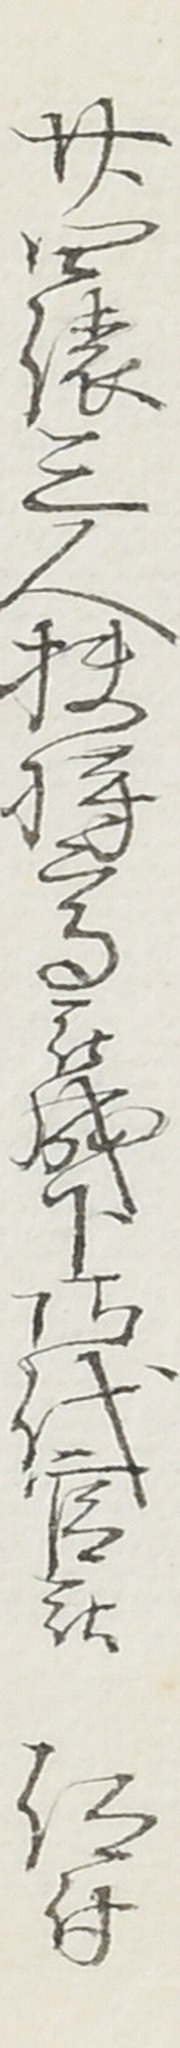廿四俵三人扶持高被成下御代官被仰付
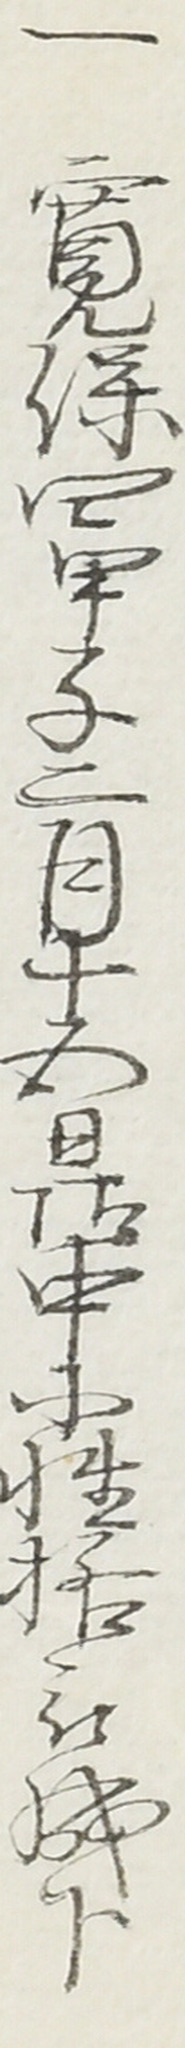一寛保四甲子二月十五日御中小性格被成下
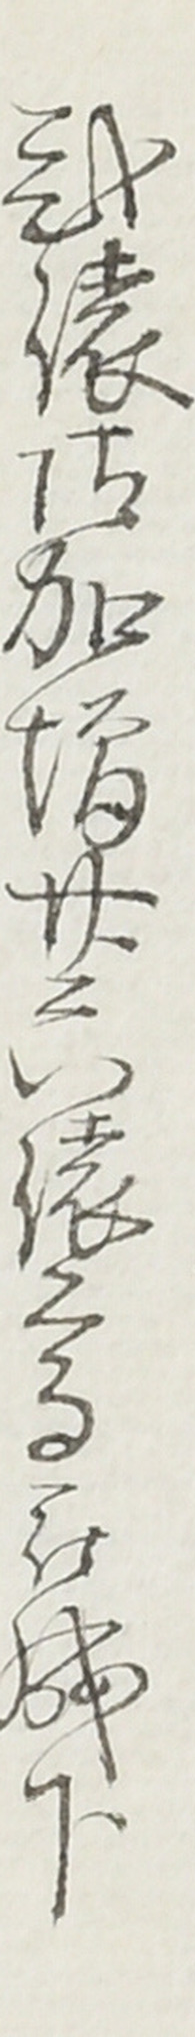弐俵御加増廿六俵高被成下
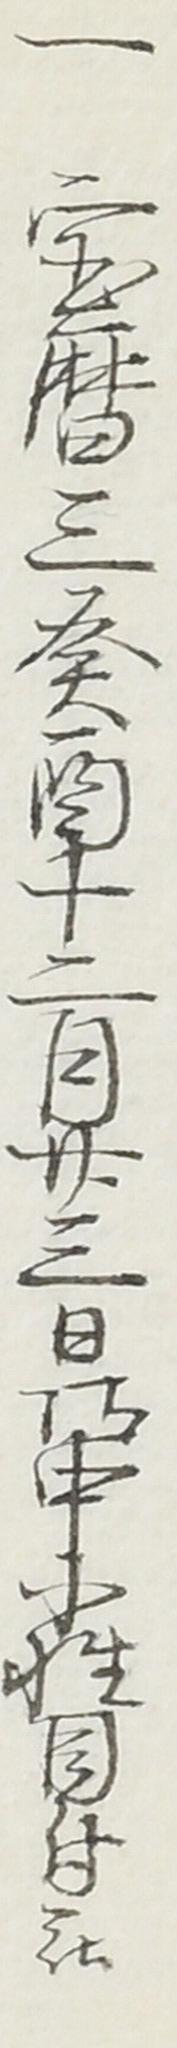一宝暦三癸酉十二月廿三日御中小性目付被
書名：給人諸士勤仕録（七）
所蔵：伊那市立高遠町図書館・合同会社AMANE
